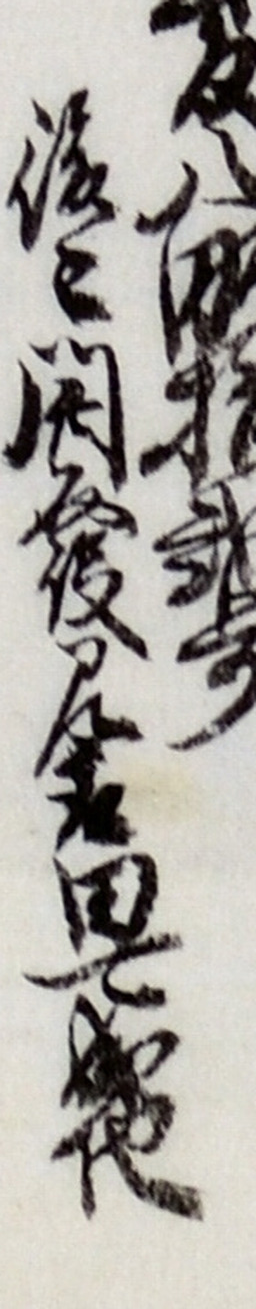後々開発見取田可成地
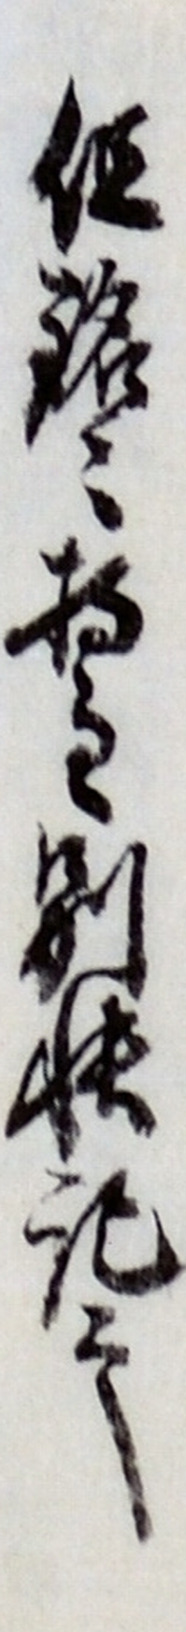但銘々持主別帳記之
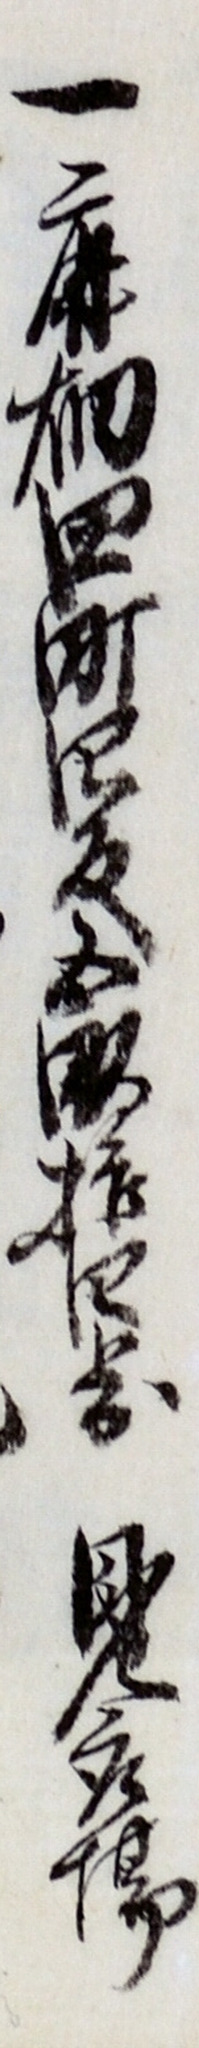一麻畑四町四反五畝拾四歩見取場
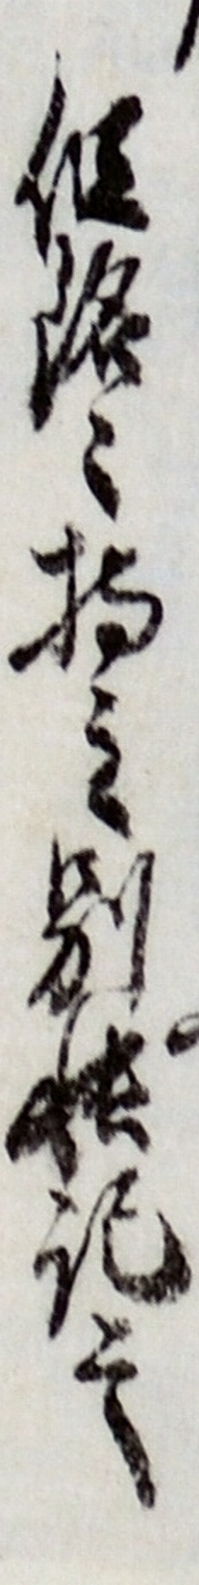但銘々持主別帳記之
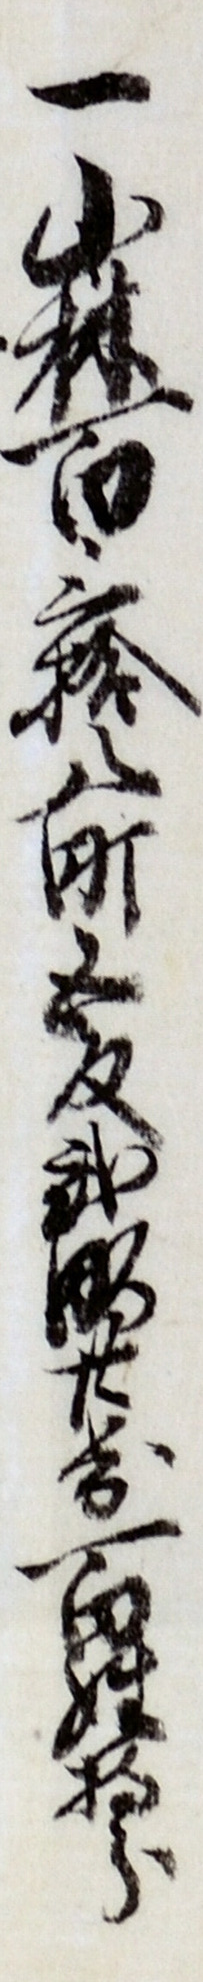一山林百三拾八町五反歩弐畝廿歩百姓持分
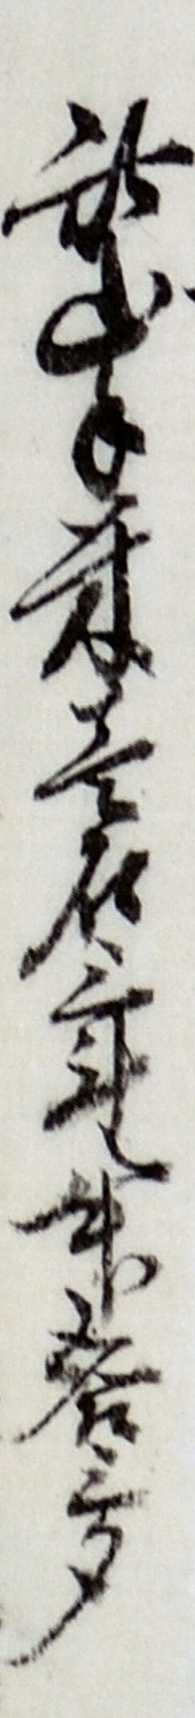此山手米壱石三斗八升五合三勺
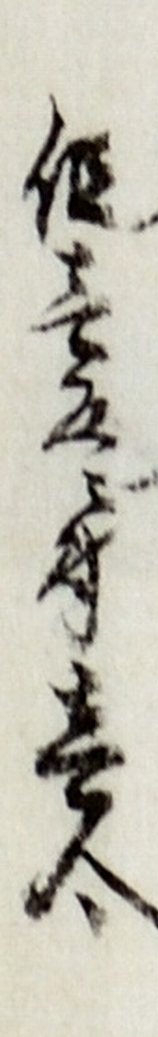但壱反ニ付壱合
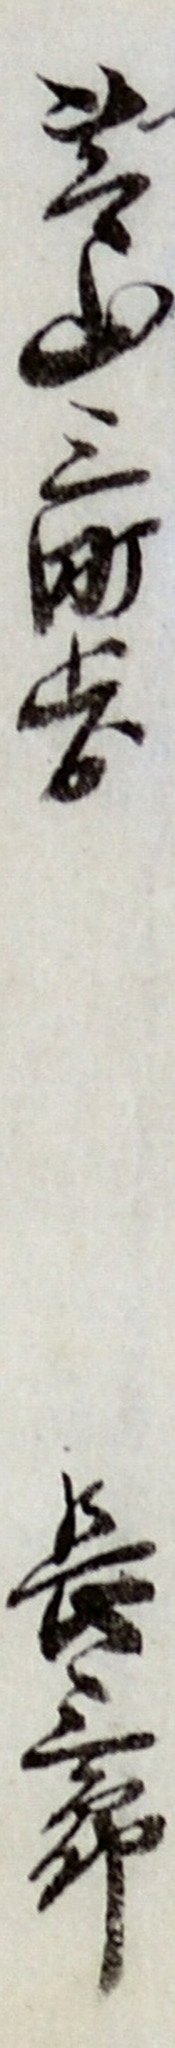芝山三町歩長三郎
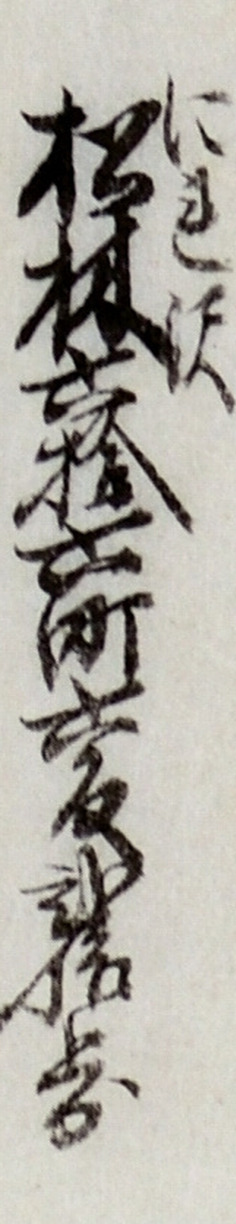松林六拾六町六反弐拾歩村中

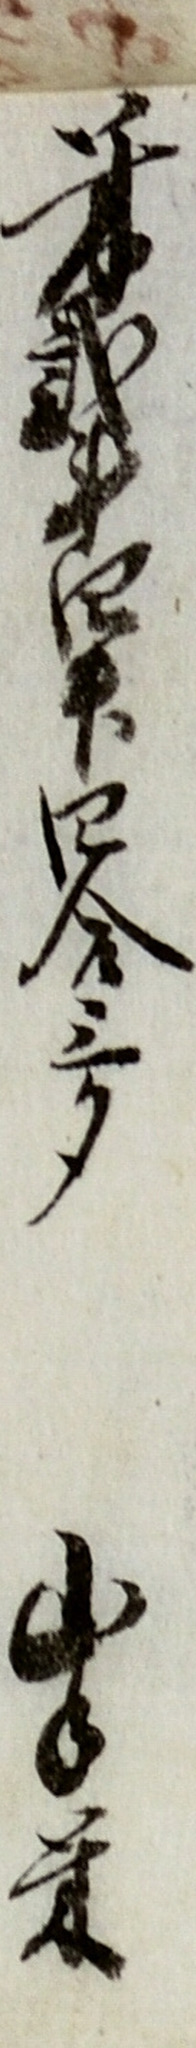米弐斗四升四合三勺山手米
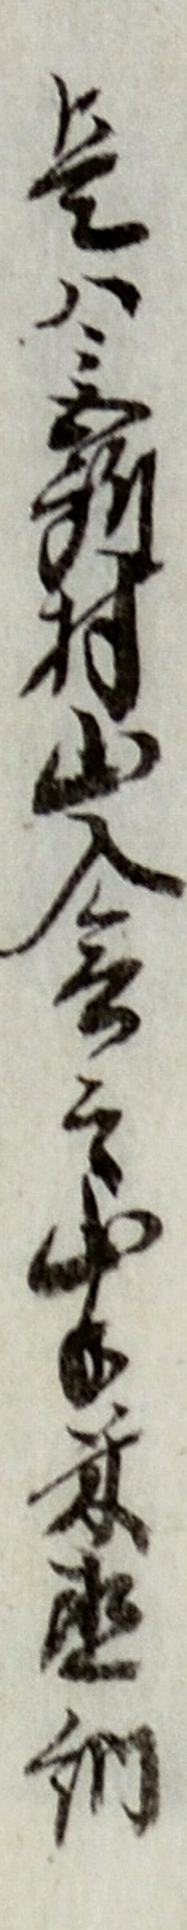是ハ宮所村山入会之山手米直納

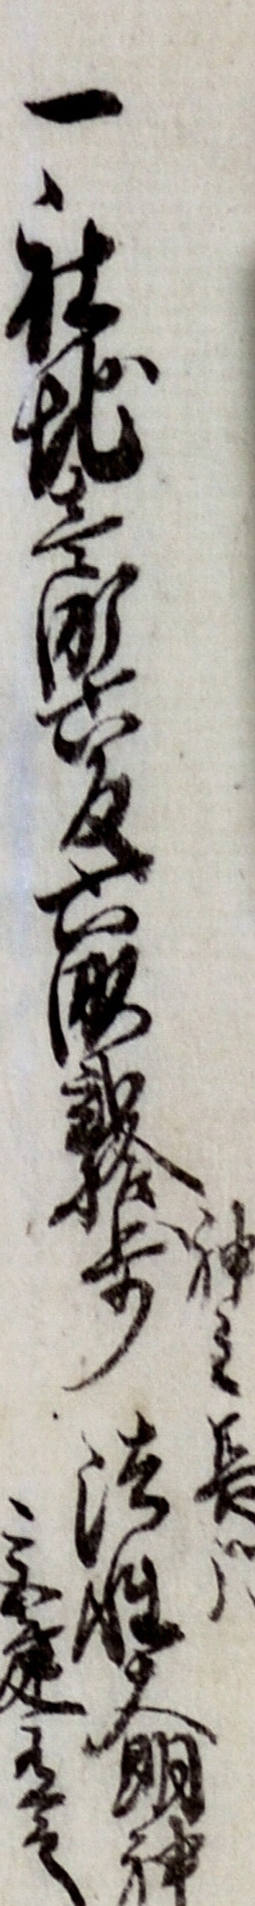一社地壱町六反六畝弐拾歩法性大明神
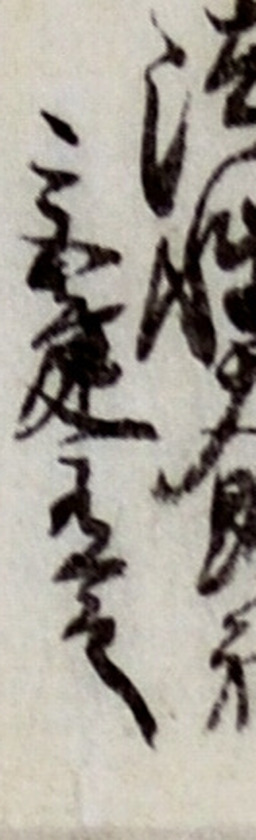宮建有之
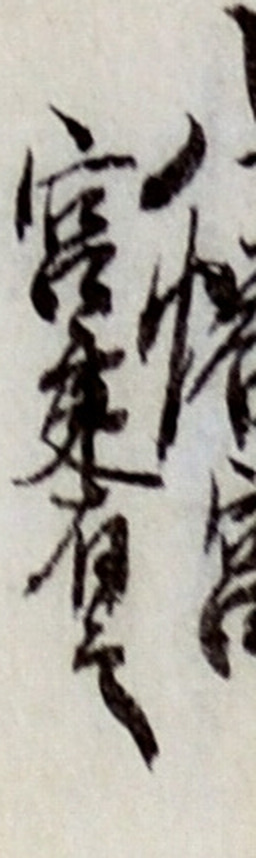宮建有之
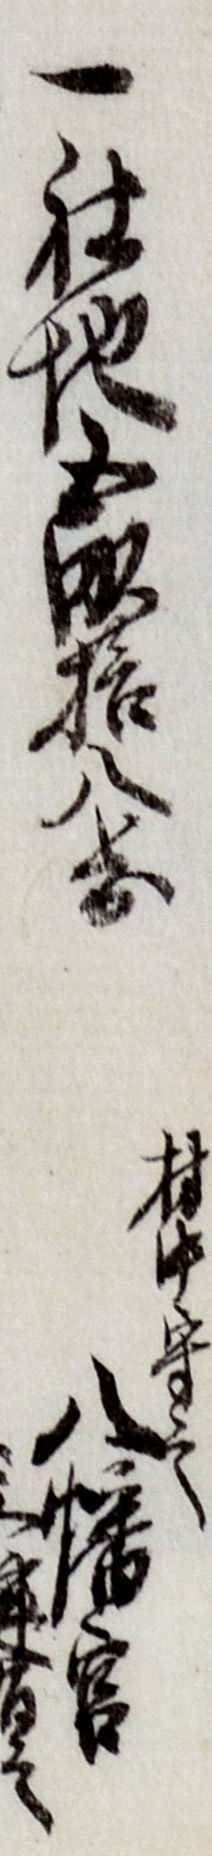一社地五畝拾八歩八幡宮
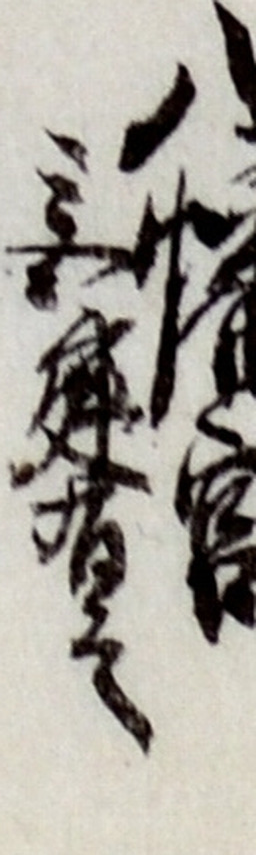宮建有之
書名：御領分中山林社地手控
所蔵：伊那市立高遠町図書館・合同会社AMANE
